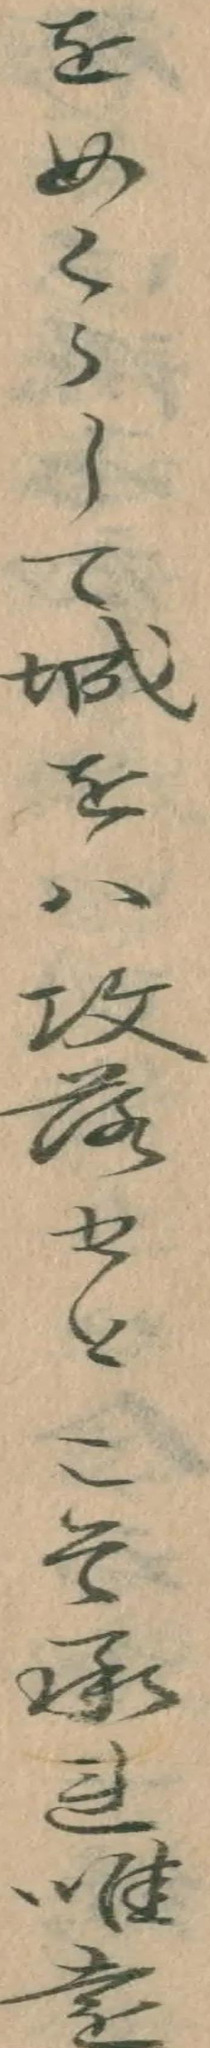をめくらして城をは攻落せとこそ承連唯遠
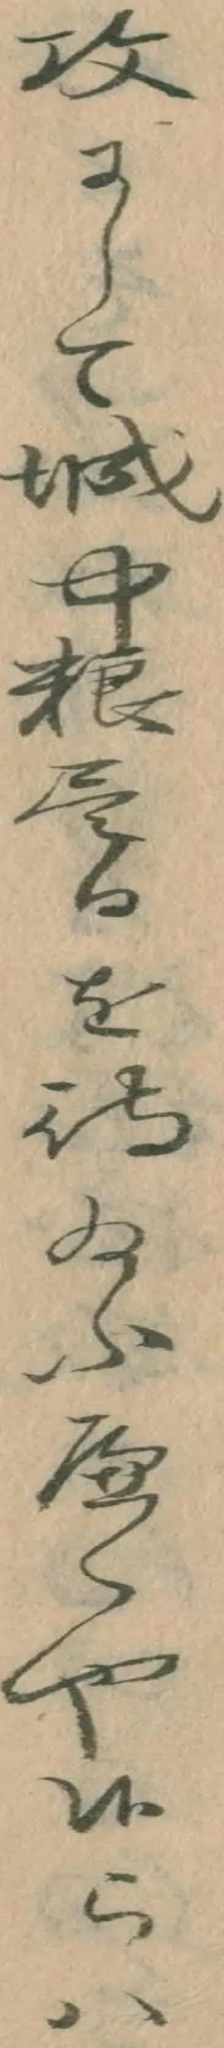攻尓して城中粮尽るを待ゐふ扁くや候らは

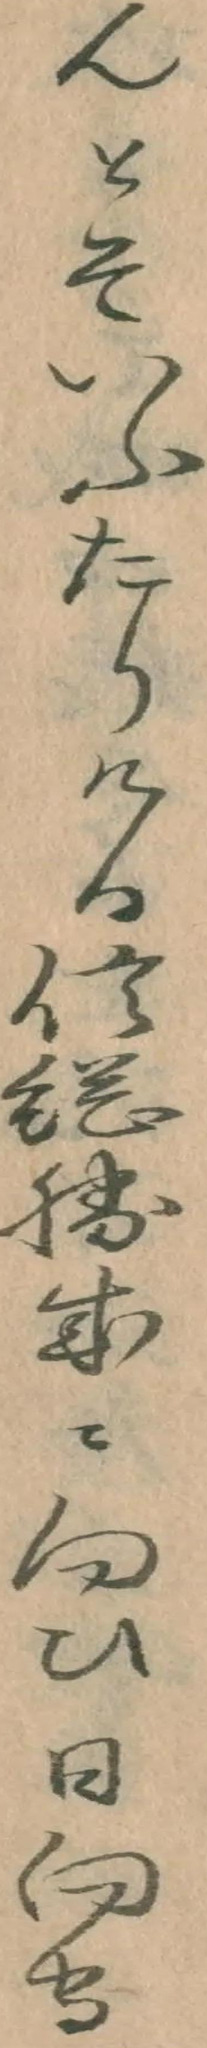んとそいふたりける信綱勝成に向ひ日向守
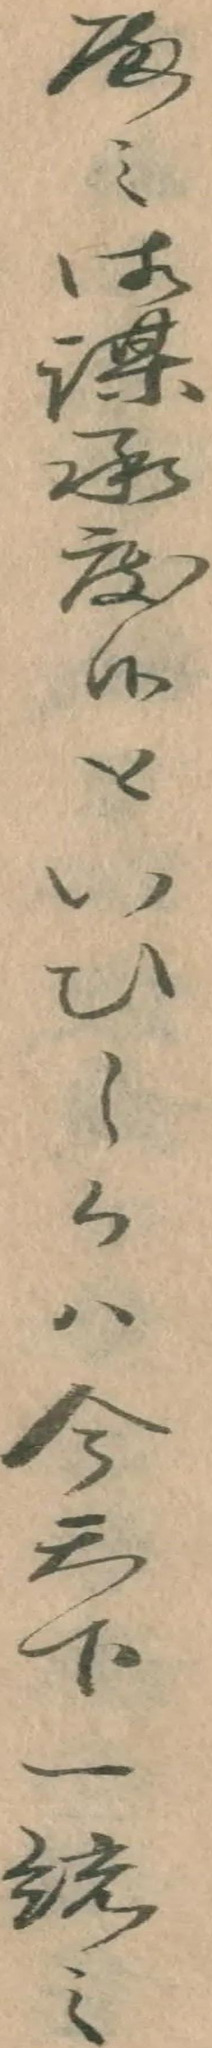殿之御謀承度候といひしかは今天下一統之
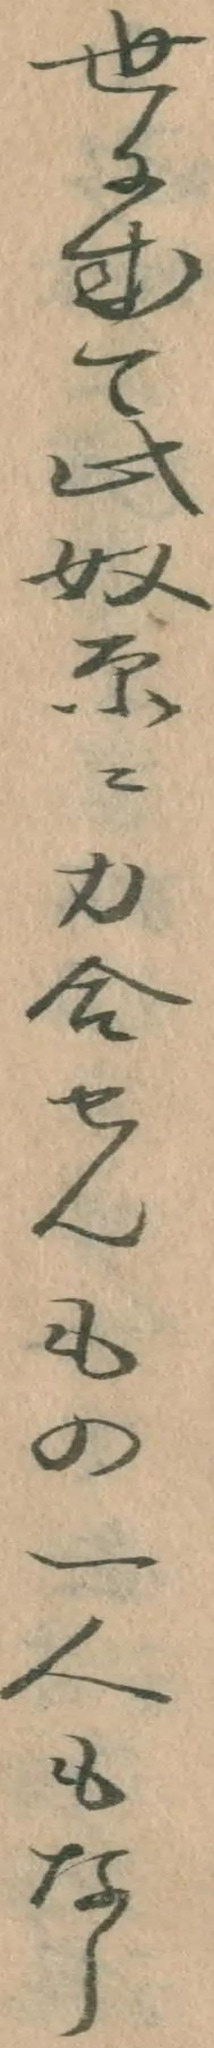世尓成て此奴原に力合せんもの一人もなし
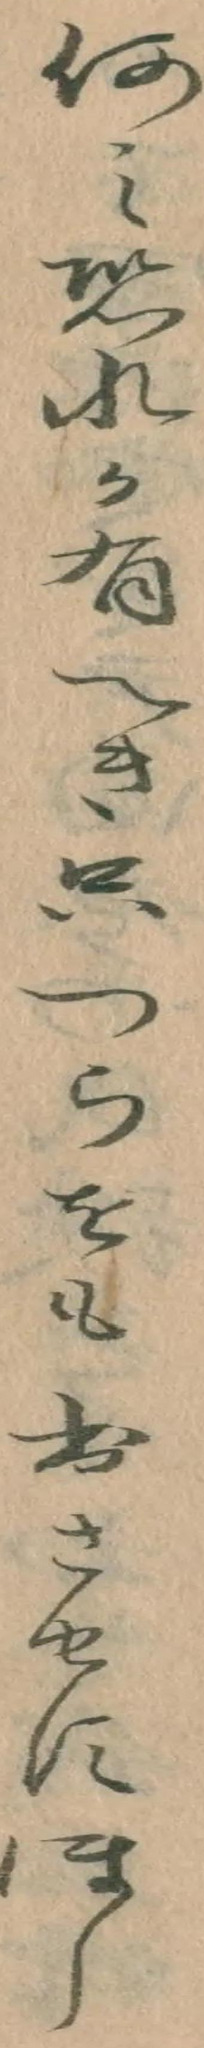何之恐れか有へき只つらをも出させ須ほし
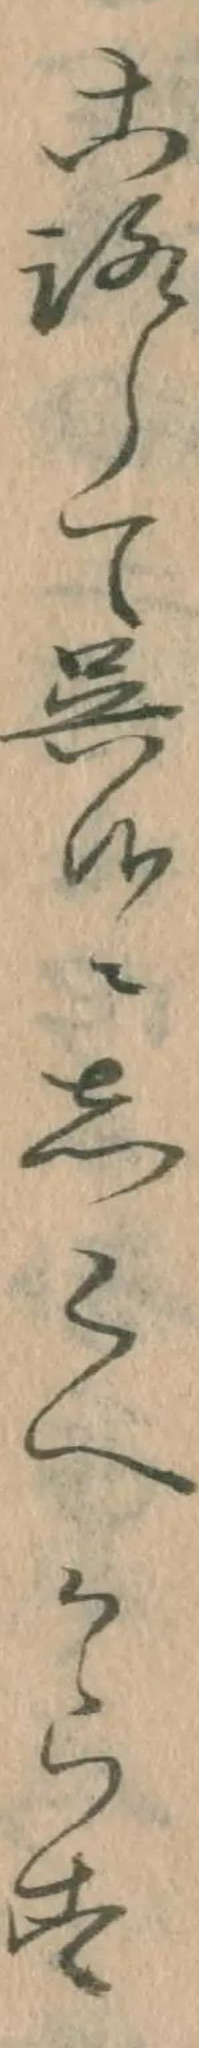古路して呉候に志くへから春
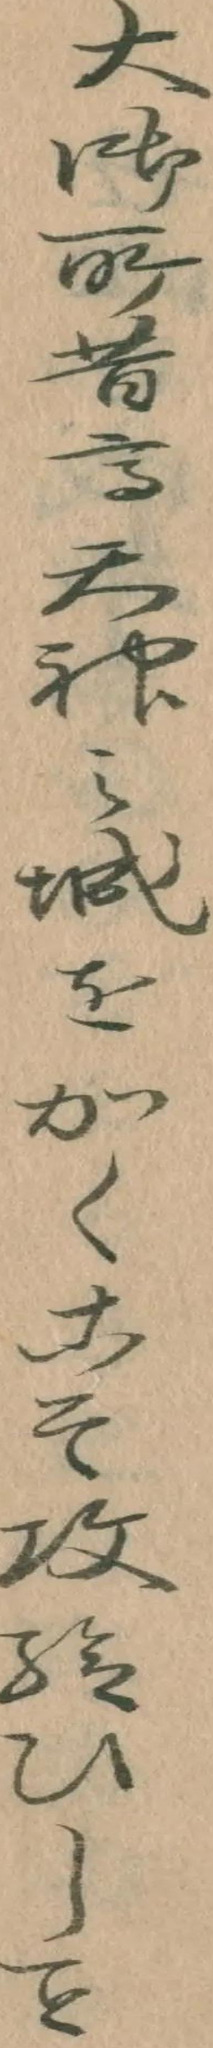大御所昔高天神之城を加く古そ攻給ひし事
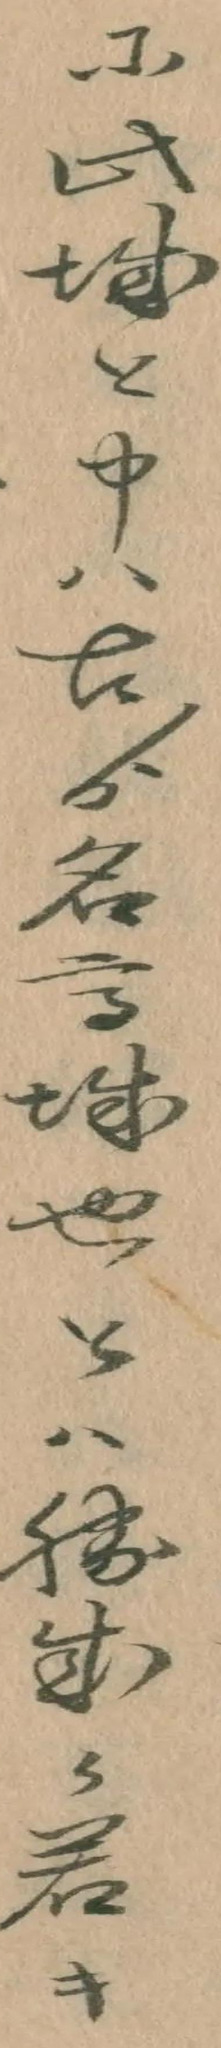尓此状と申は古ゟ名高城也とは勝成か若き
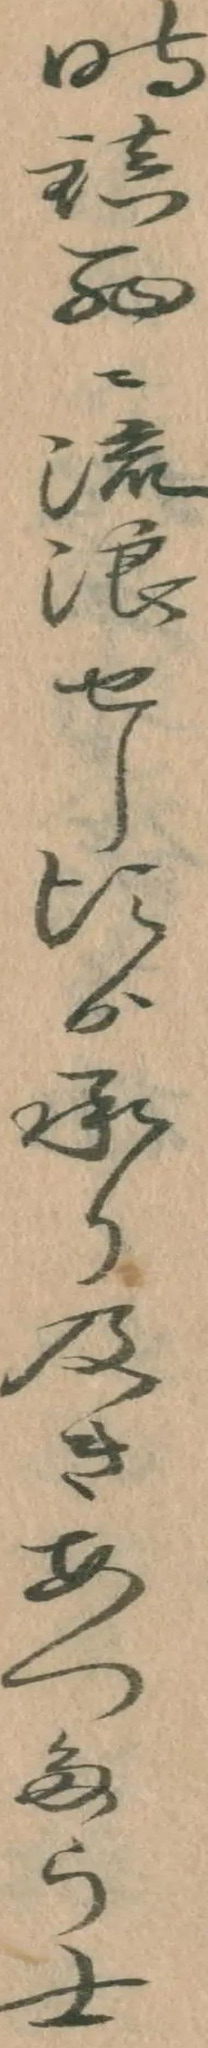時鎮西に流浪せし頃ゟ承り及きあつ多ら士
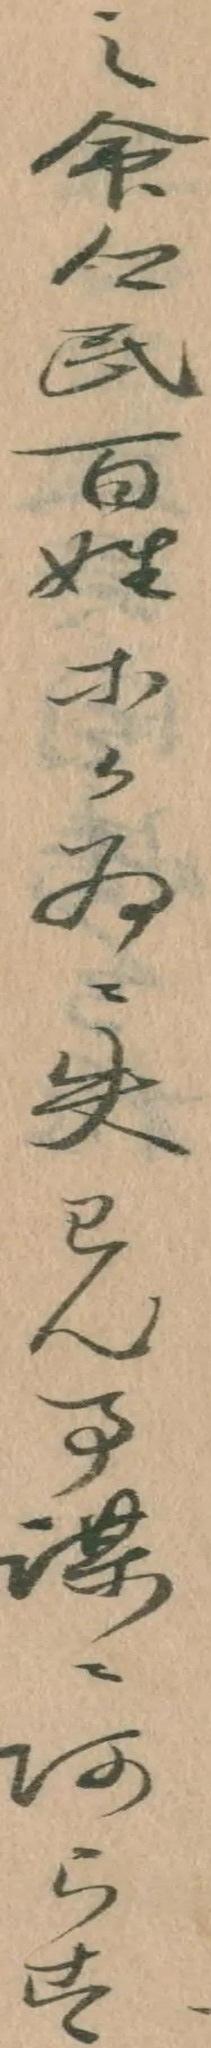之命郷民百姓等かゐに失已ん事謀に阿ら春
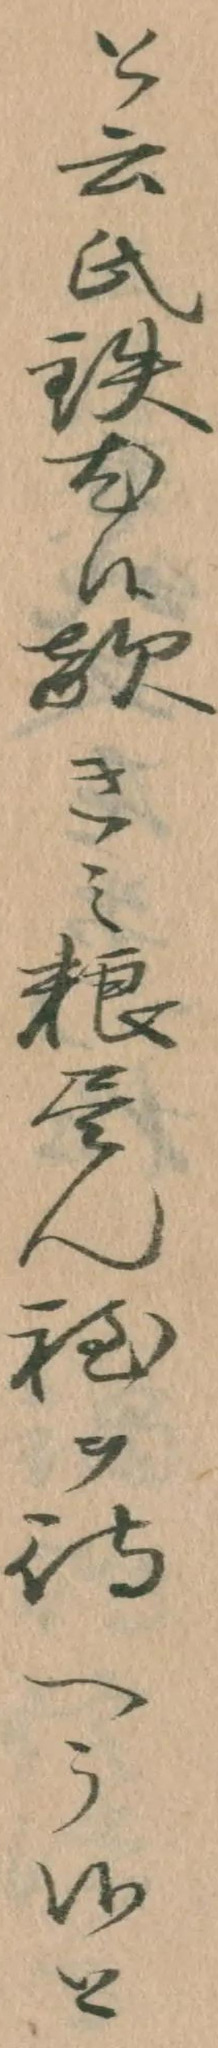と云氏鉄尤候敵き之粮尽ん程を待へう候と
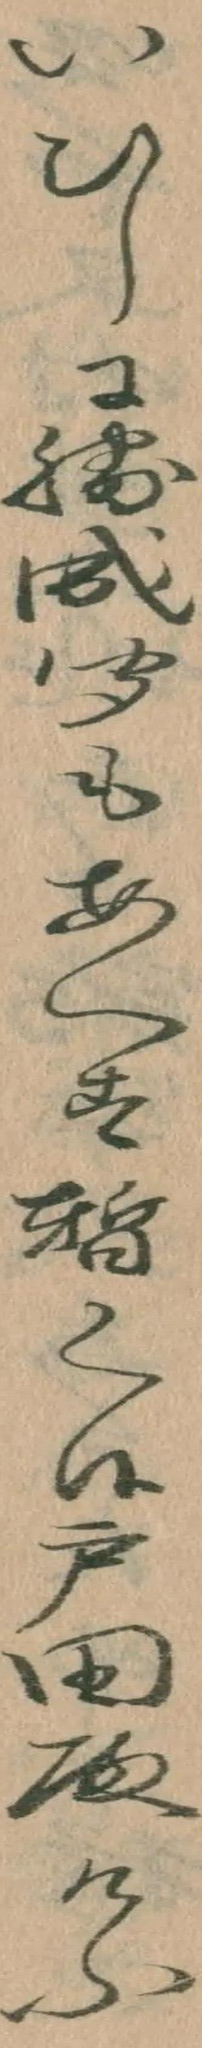いひし尓勝成聞もあへ春暫く候戸田殿けふ
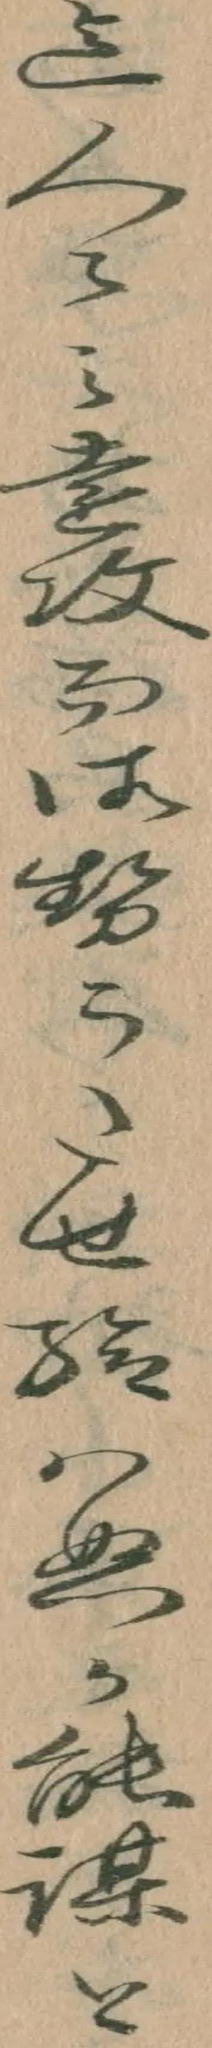迄人々之遠攻而御勢うたせ給は怒か能謀と
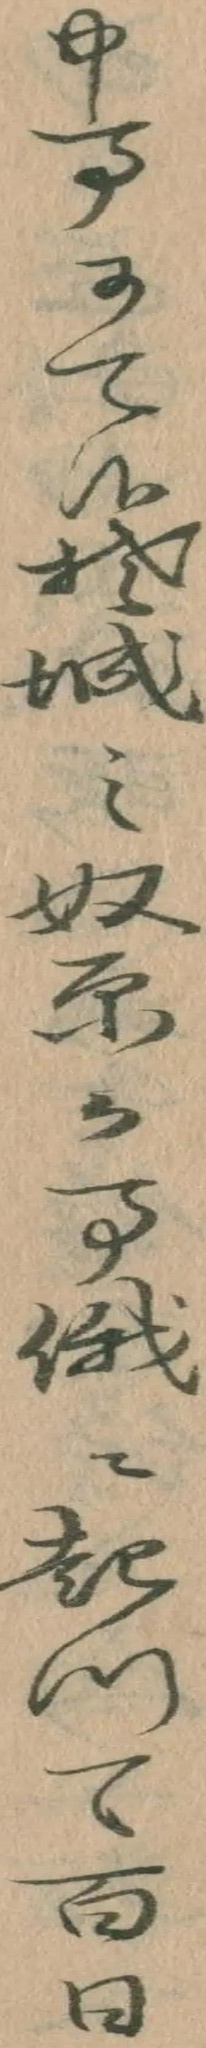申事尓て候楚城之奴原か事俄に起川て百日
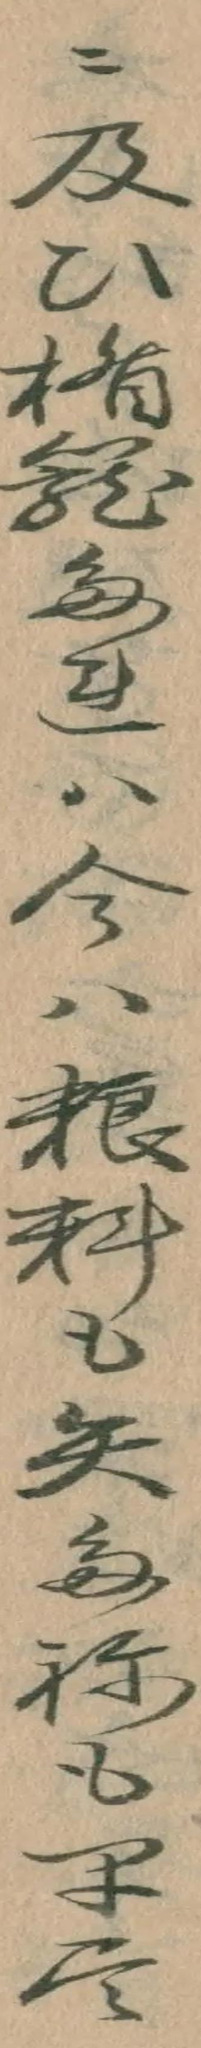に及ひ楯籠多連は今は粮料も矢多祢も早尽
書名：切支丹御退治記 49巻. [7]
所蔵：国立国会図書館 National Diet Library, JAPAN
